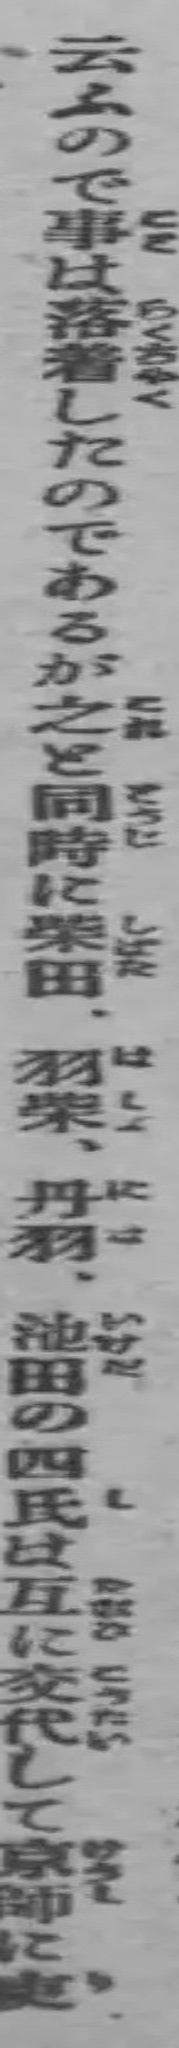云ふので事は落着したのであるが之と同時に柴田、羽柴、丹羽、池田の四氏は互に交代して京師に吏
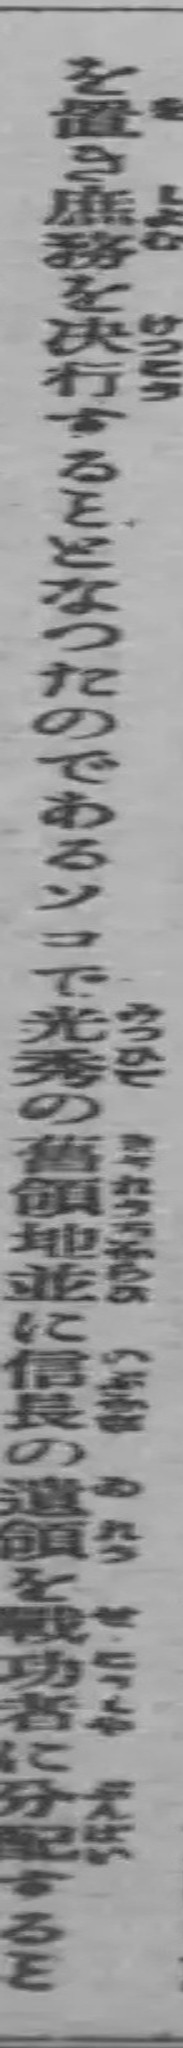を置き庶務を決行することとなつたのであるソコで光秀の旧領地並に信長の遺領を戦功者に分配すること
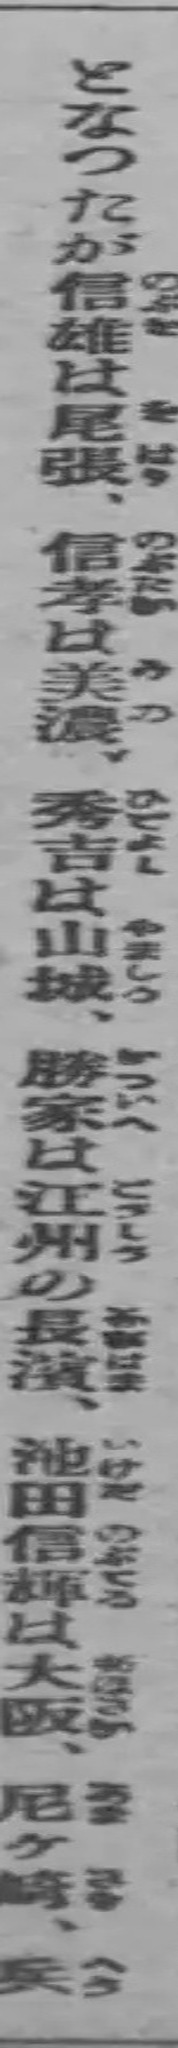となつたが信雄は尾張、信孝は美濃、秀吉は山城、勝家は江州の長浜、池田信輝は大阪、尼ケ崎、兵
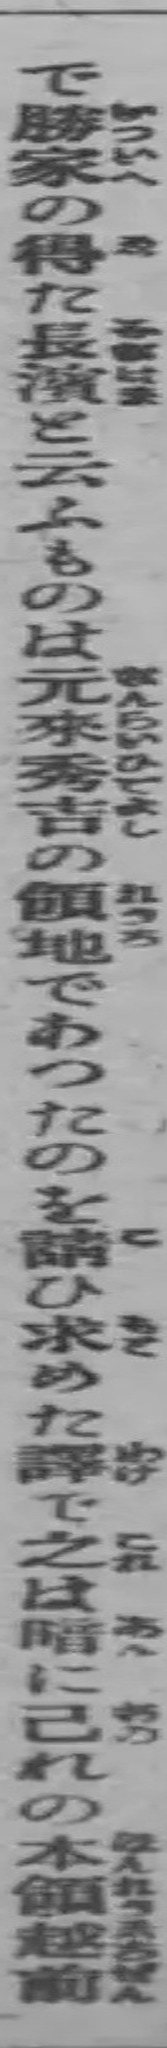で勝家の得た長浜と云ふものは元来秀吉領地であつたのを請ひ求めた訳で之は暗に己れの本領越前
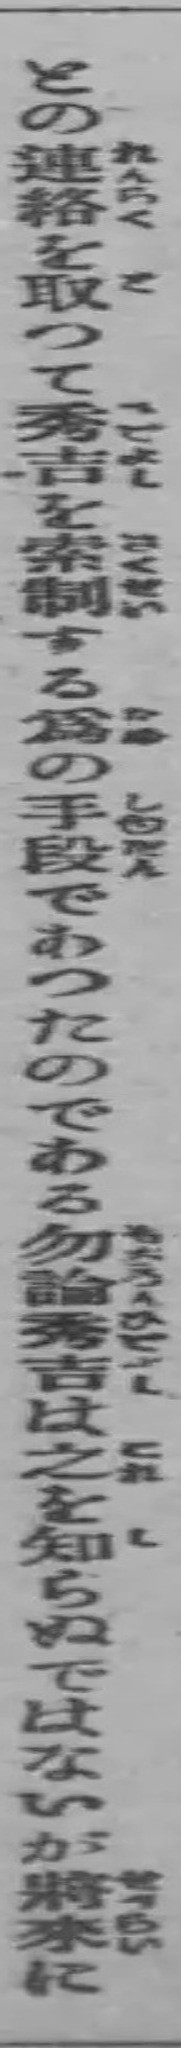との連絡を取つて秀吉を索制する為の手段であつたのである勿論秀吉は之を知らぬではないが将来に
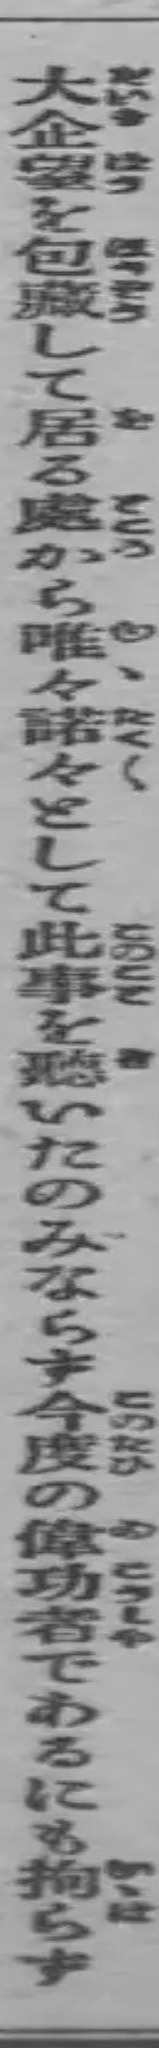大企望を包蔵して居る処から唯々諾々として此事を聴いたのみならず今度の偉功者であるにも拘らず
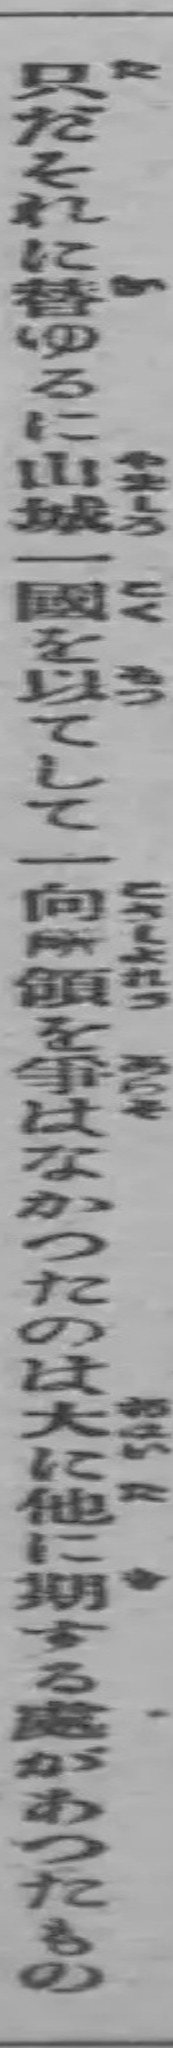只だそれに替ゆるに山城一国を以てして一向所領を争はなかつたのは大に他に期する処があつたもの
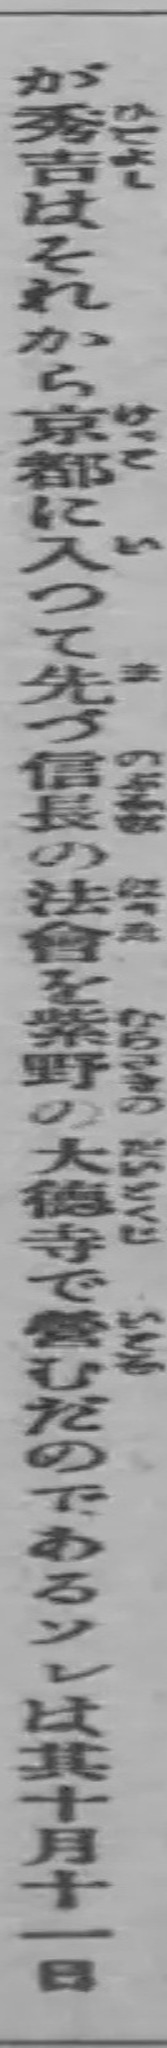が秀吉はそれから京都に入つて先づ信長の法会を紫野の大徳寺で営むだのであるソレは其十月十一日
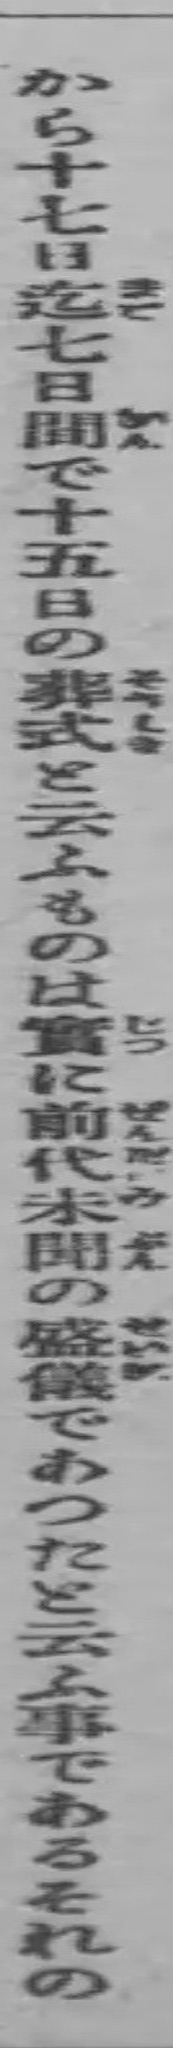から十七日迄七日間で十五日の葬式と云ふものは実に前代未聞の盛儀であつたと云ふ事であるそれの
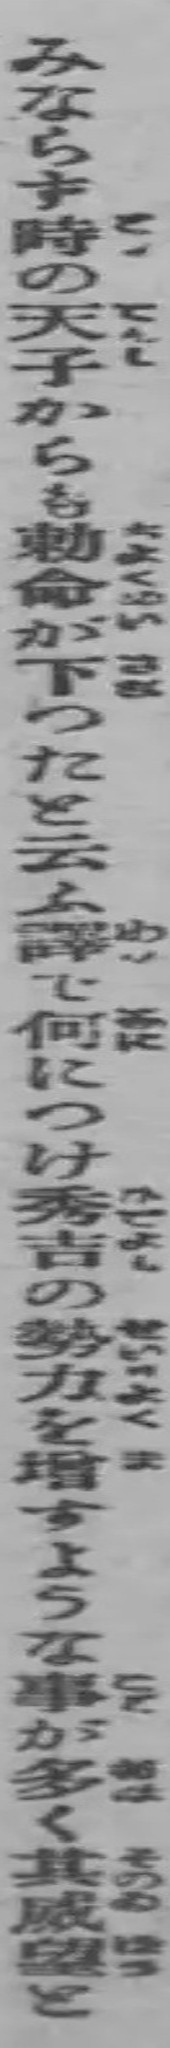みならず時の天子からも勅命が下つたと云ふ訳で何につけ秀吉の勢力を増すような事が多く其威望と
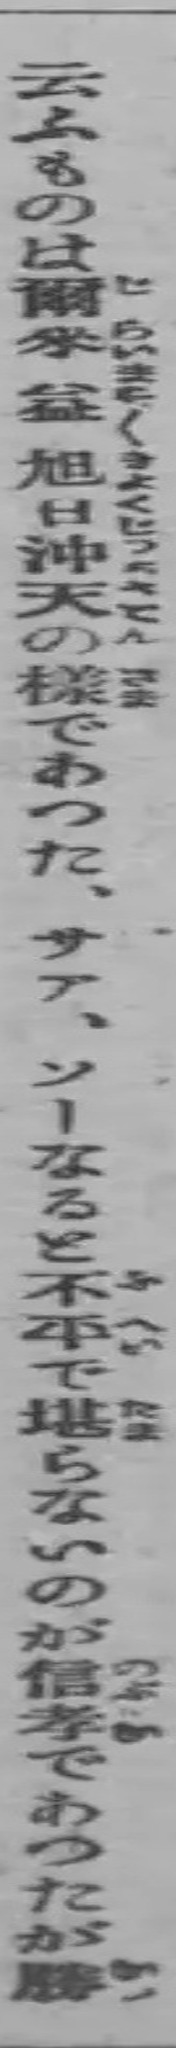云ふものは爾来益旭日沖天の様であつた、サア、ソーなると不平で堪らないのが信孝であつたが勝
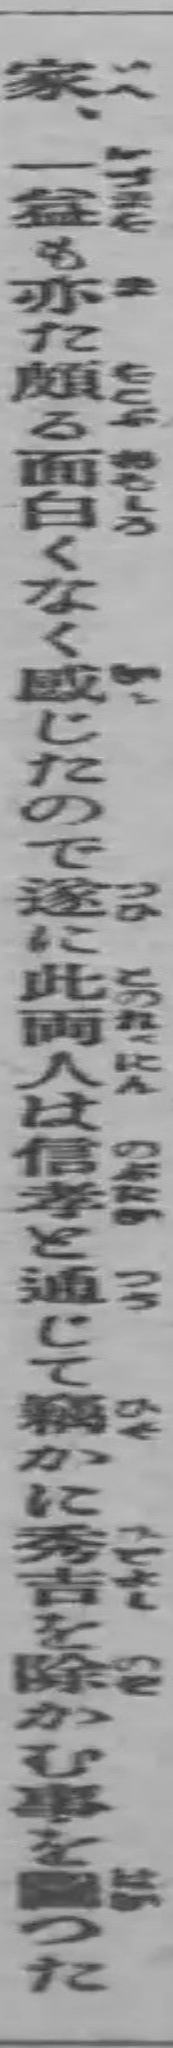家、一益も亦た頗る面白くなく感じたので遂に此両人は信孝と通じて竊かに秀吉を除かむ事を図つた
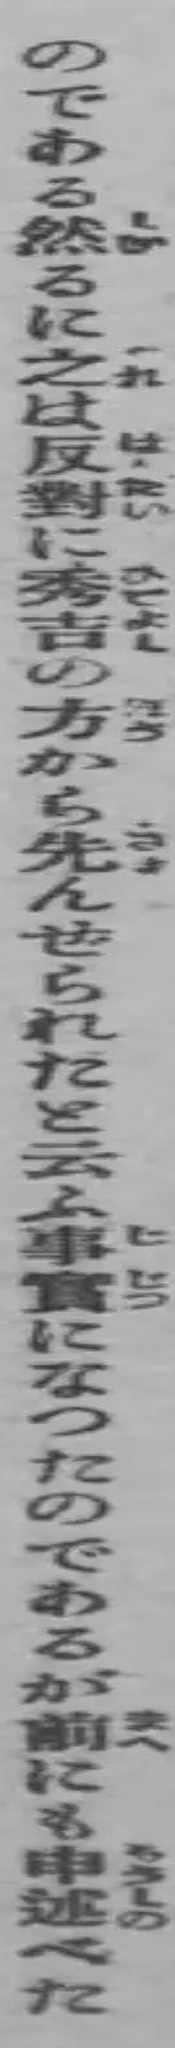のである然るに之は反対に秀吉の方から先んぜられたと云ふ事実になつたのであるが前にも申述べた
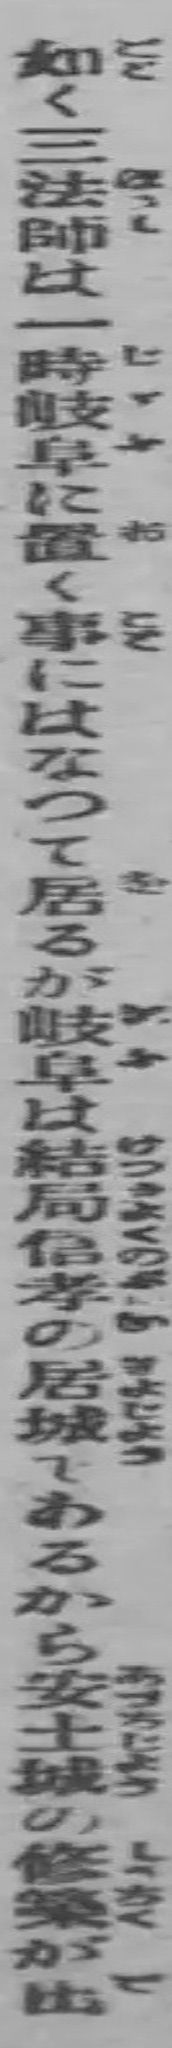如く三法師は一時岐阜に置く事にはなつて居るが岐阜は結局信孝の居城であるから安土城の修築が出
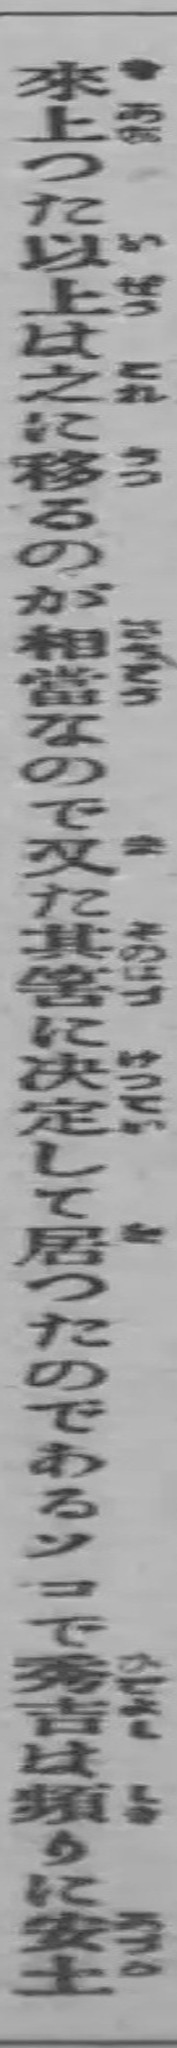来上つた以上は之に移るのが相当なので又た其筈に決定して居つたのであるソコで秀吉は頻りに安土
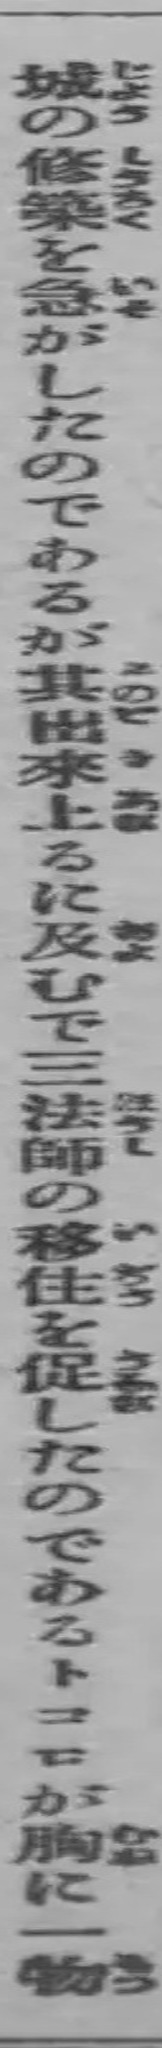城の修築を急がしたのであるが其出来上るに及むで三法師の移住を促したのであるトコロが胸に一物
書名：豊橋市史談
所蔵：国立国会図書館 National Diet Library, JAPAN
